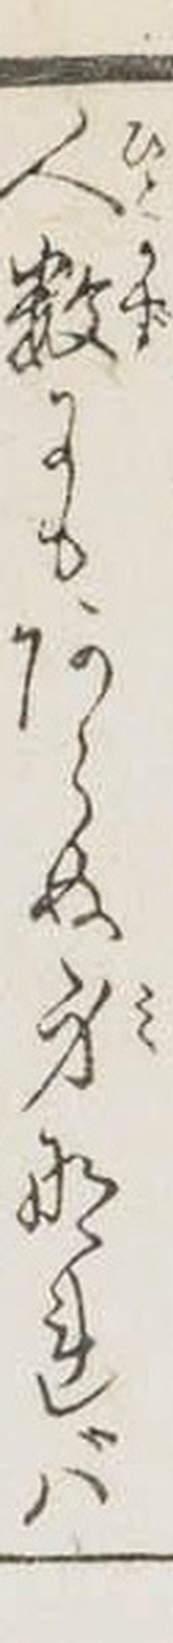人数にもあらぬ身なれば
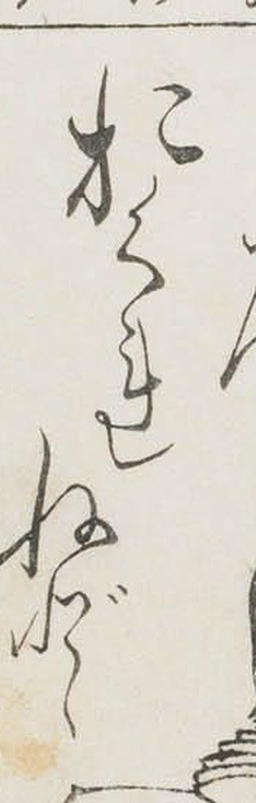おくれねど
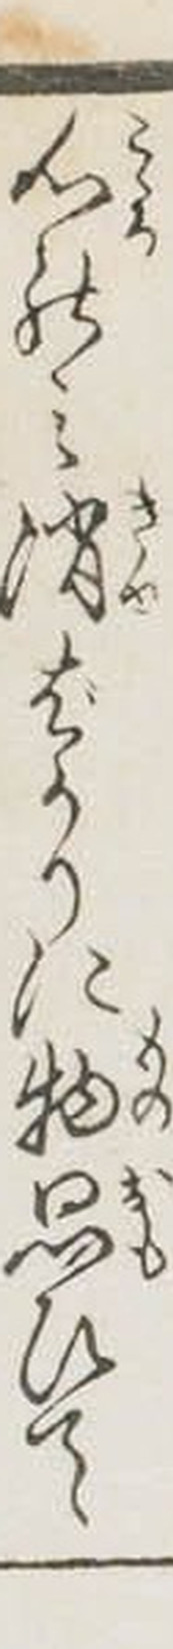心のみ消ばかりに物思ひて
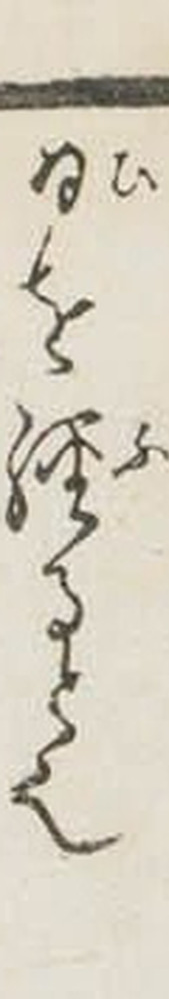日を経ると也
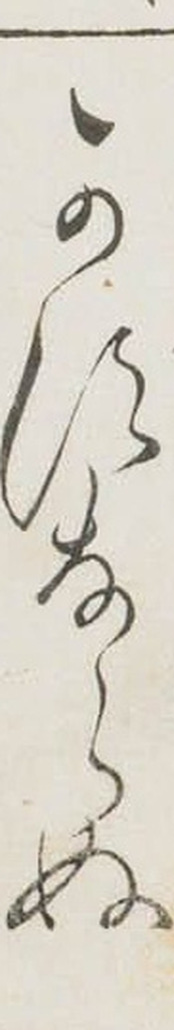かずならぬ
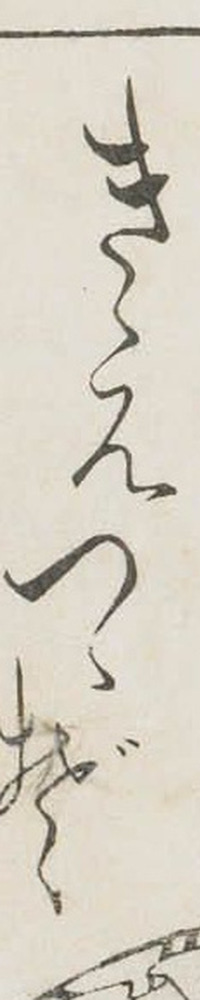きえつゝぞ

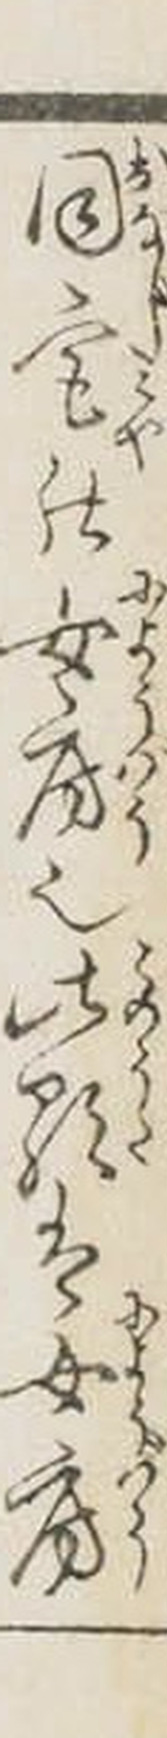同宮の女房也此は女房
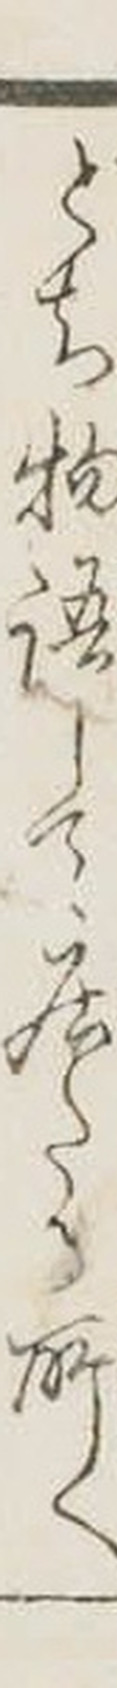どち物語して居たる所へ
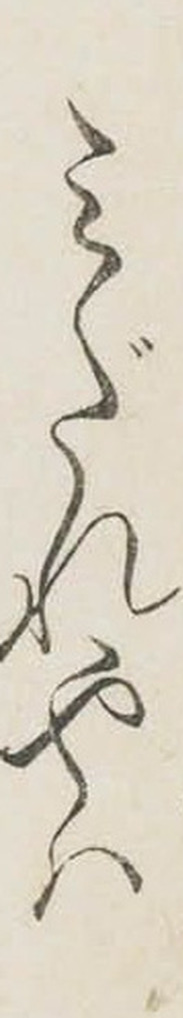みだれやは
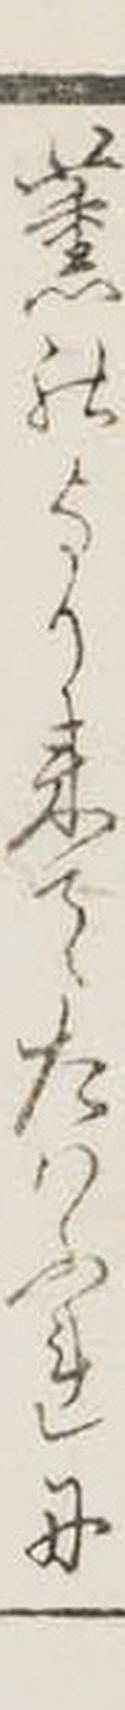薫のより来てたはふれに
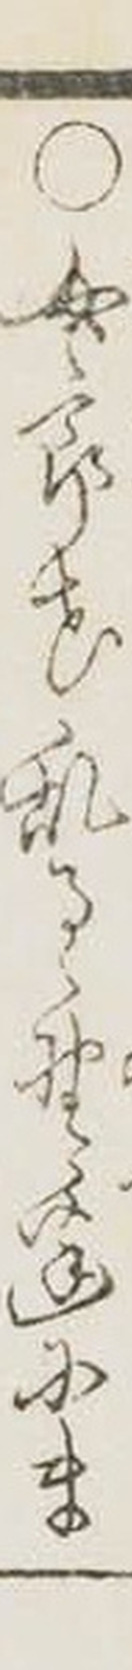○女郎花乱るゝ野辺にま
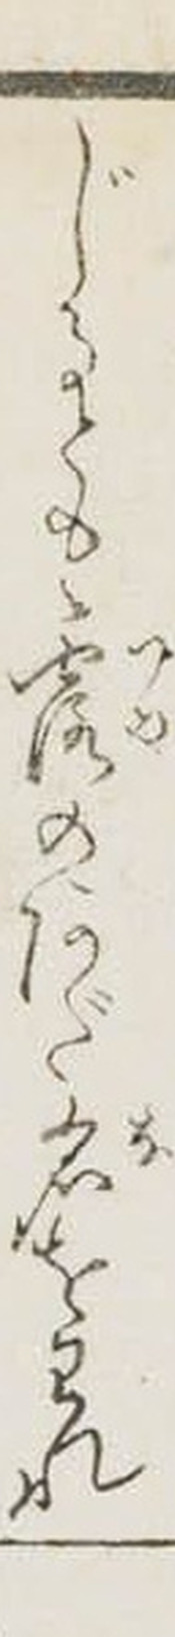じるとも露のあだ名をわれ
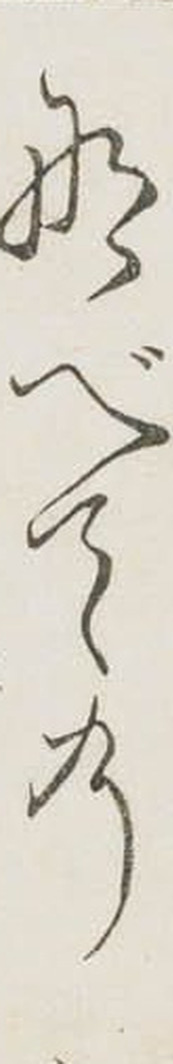なべての
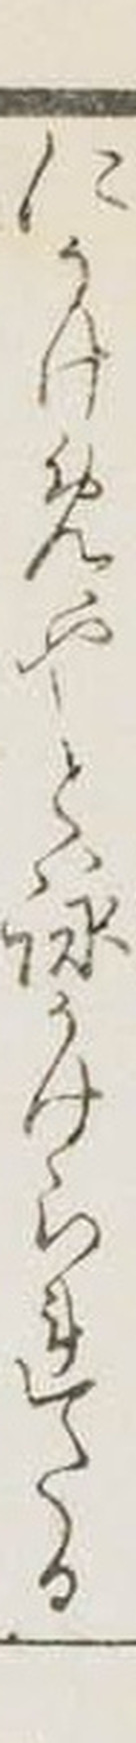にかけめやとは詠かけられたる
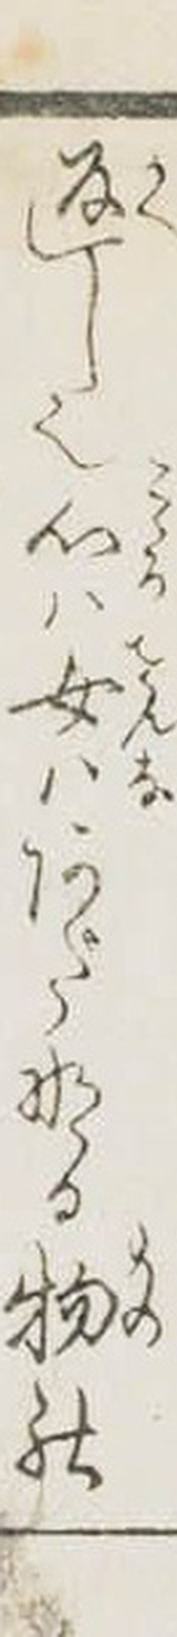返し也心は女はあだなる物の
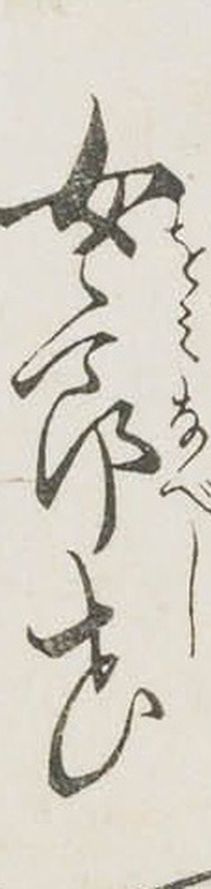女郎花
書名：源氏百人一首
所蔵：東京学芸大学教育コンテンツアーカイブ
